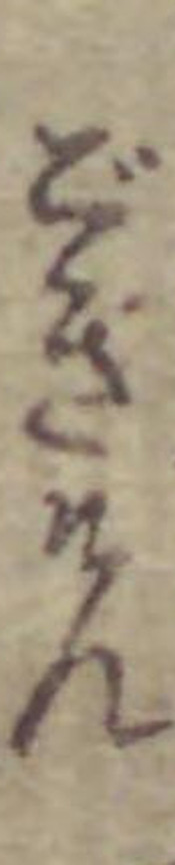ごきけん
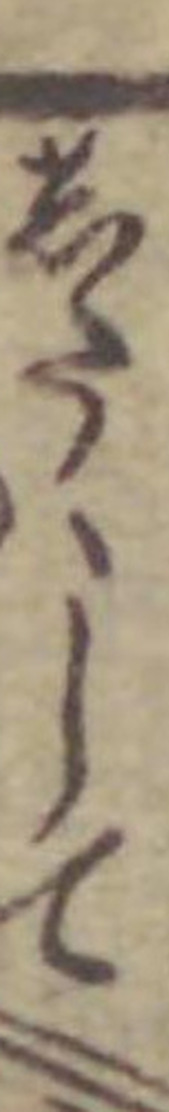したくして
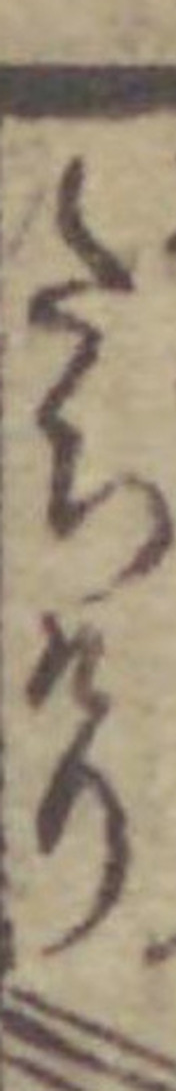たちけり
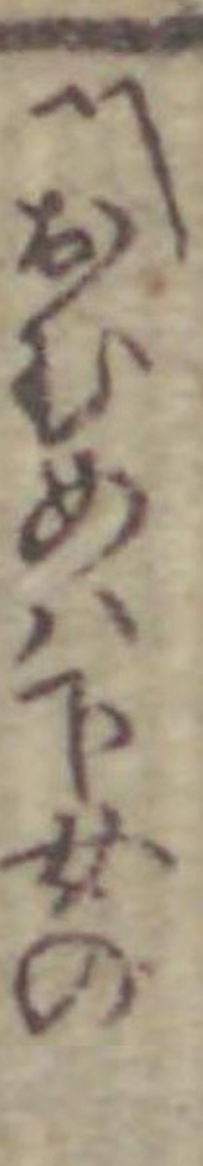〽おむめは下女の
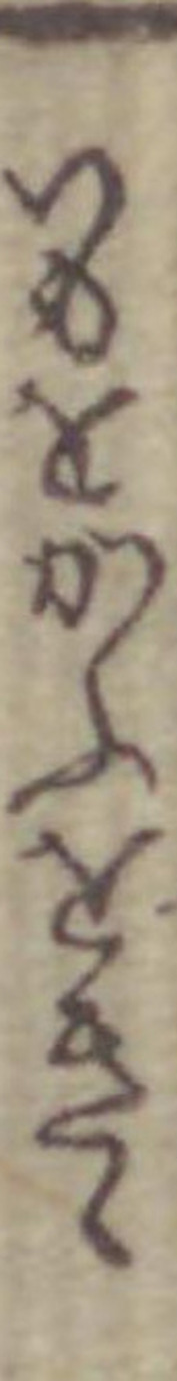いもをかふをきゝ
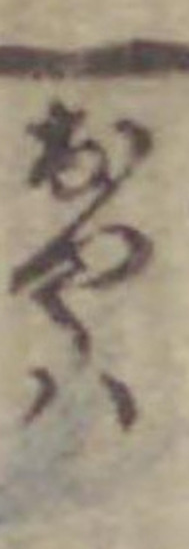おやは
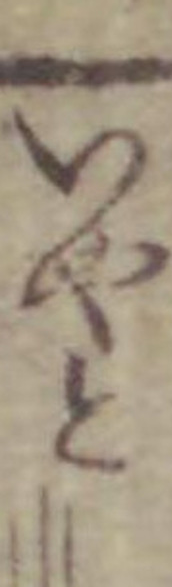いやと
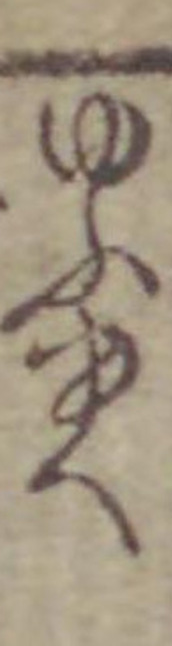ゆふゆへ
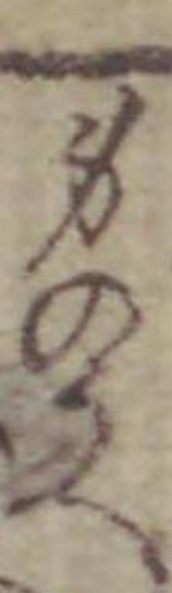身のうへ
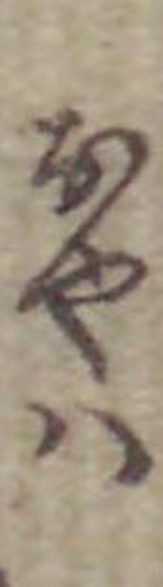おやは
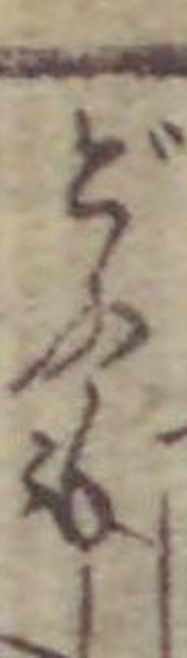どふも
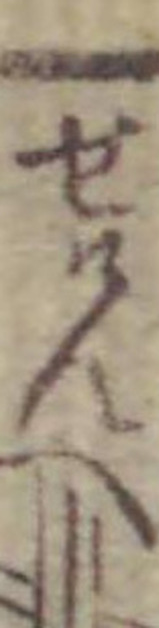せけんへ
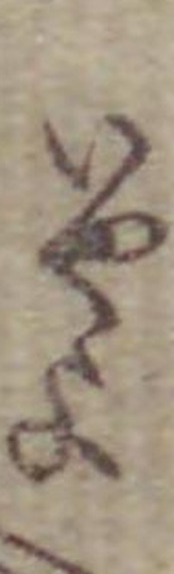いやよ

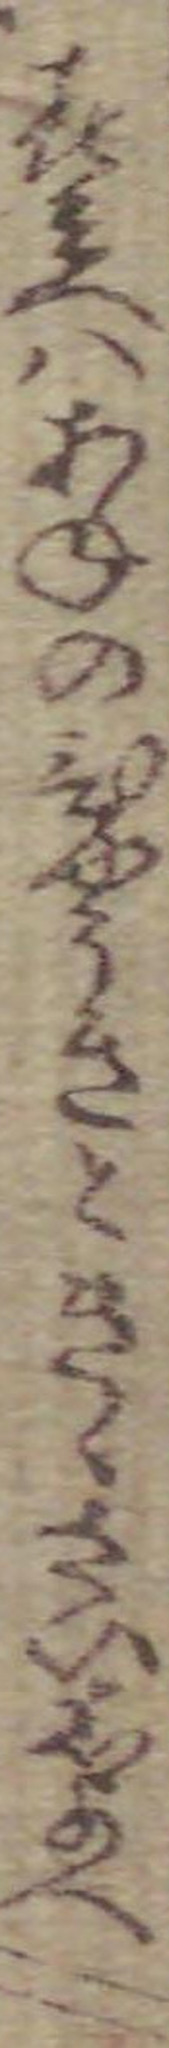喜兵へはあねのひやうきときゝさいしよへ
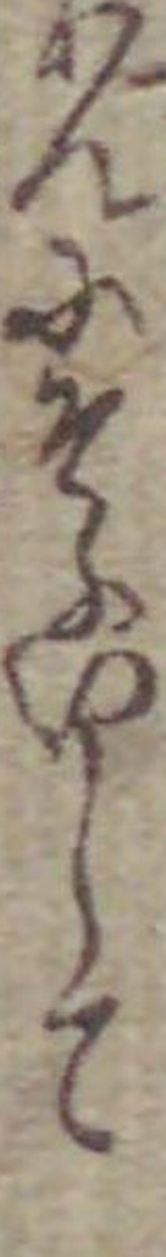あんにそふいして
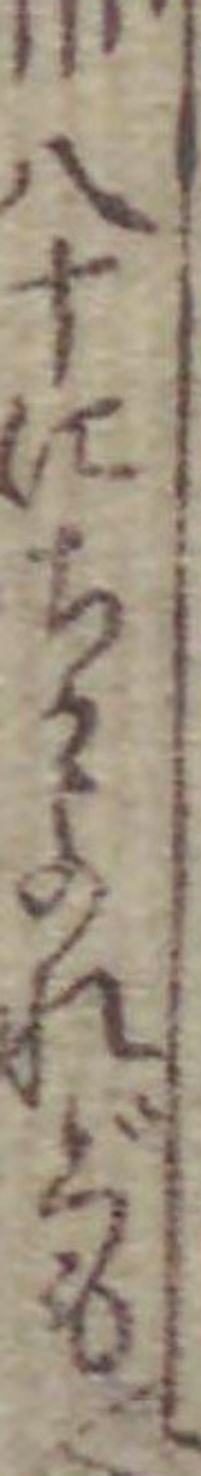八十にちかよれども
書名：親父布子鳶握 3巻
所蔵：国立国会図書館 National Diet Library, JAPAN
